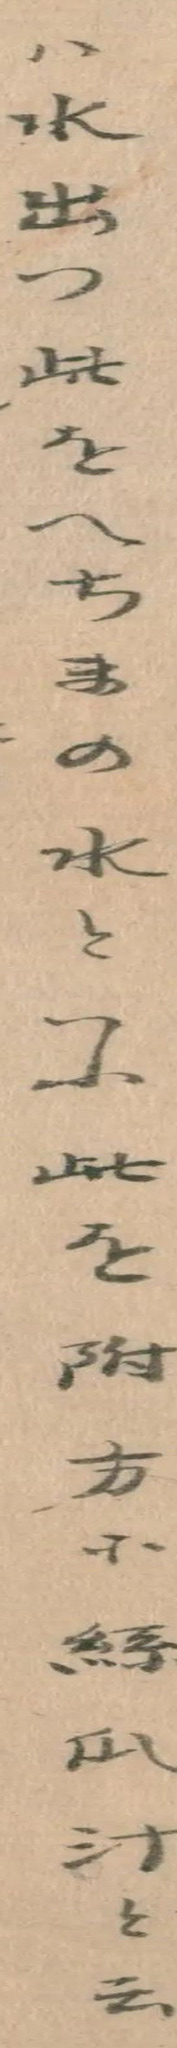は水出つ此をへちまの水といふ此を附方に糸瓜汁と云
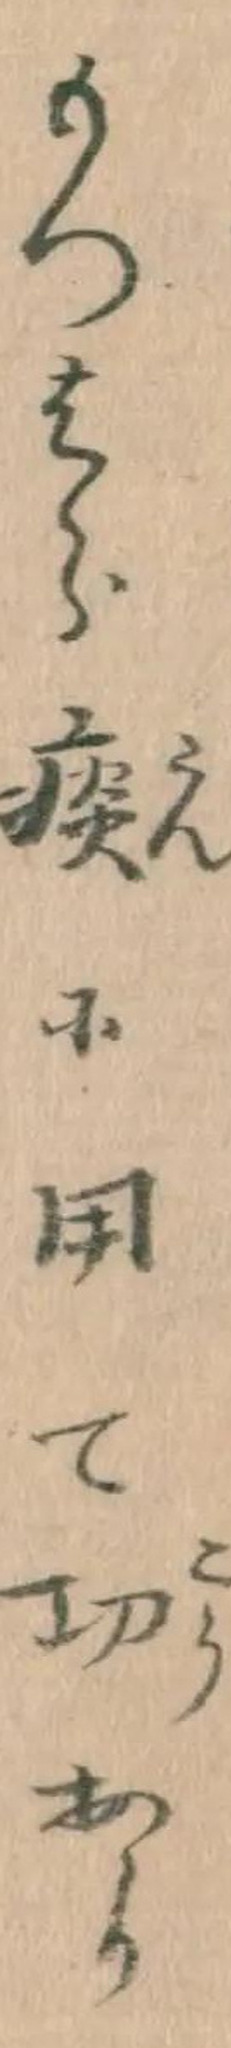もつはら痰に用て功あり

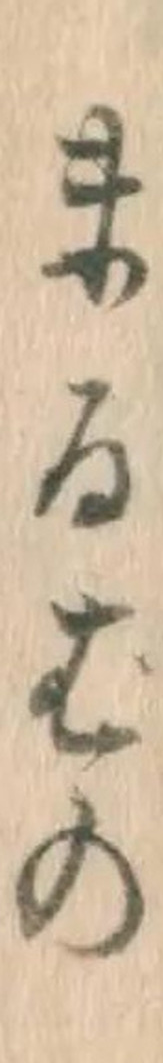まるばの
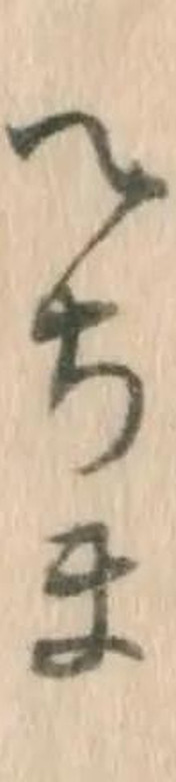へちま
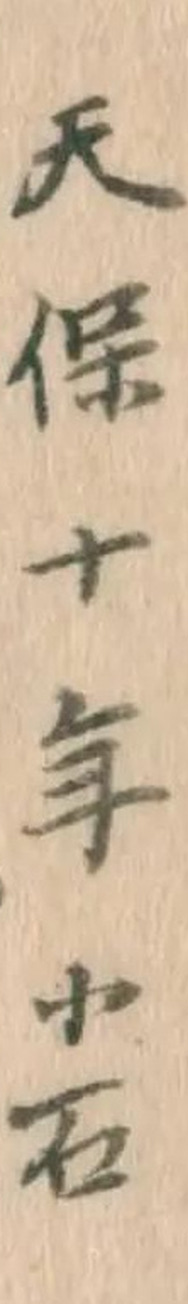天保十年小石
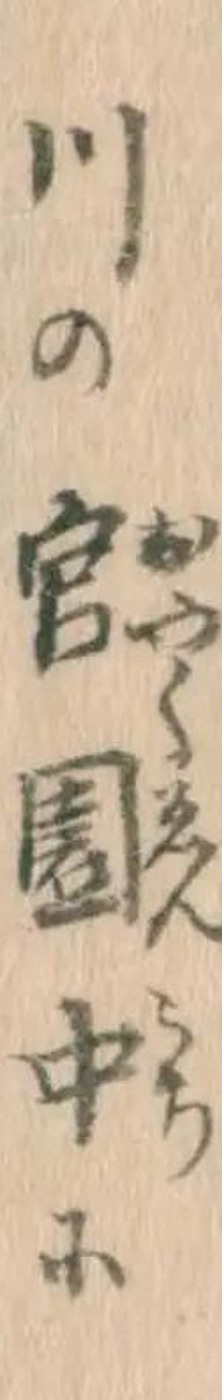川の官園中に
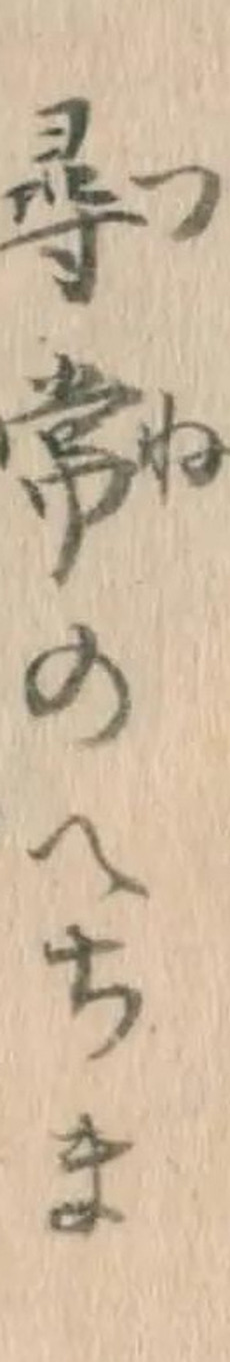尋常のへちま
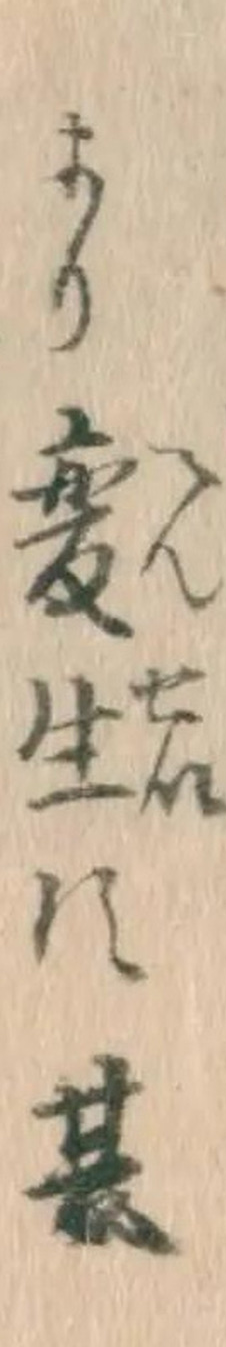より変生す其
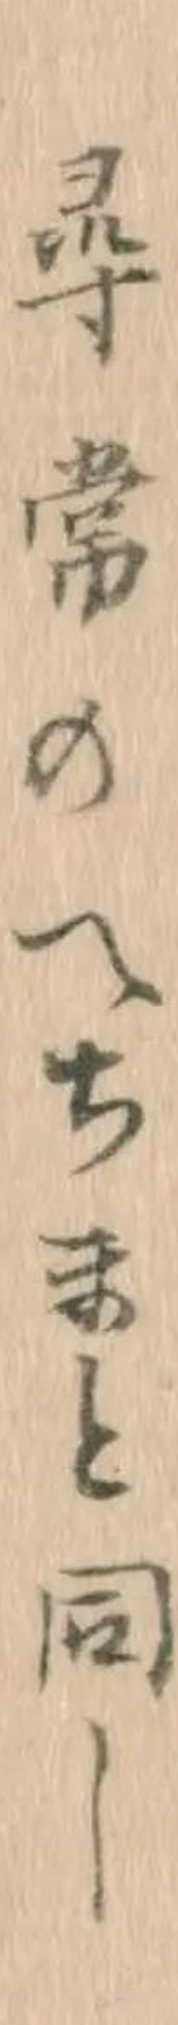尋常のへちまと同し
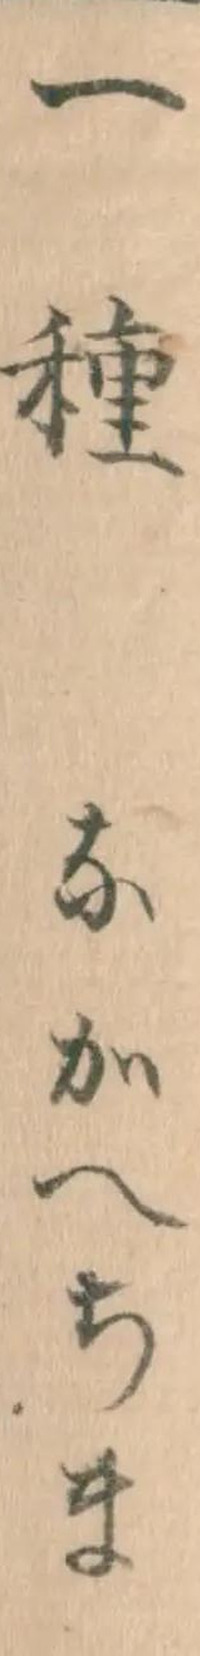一種なかへちま
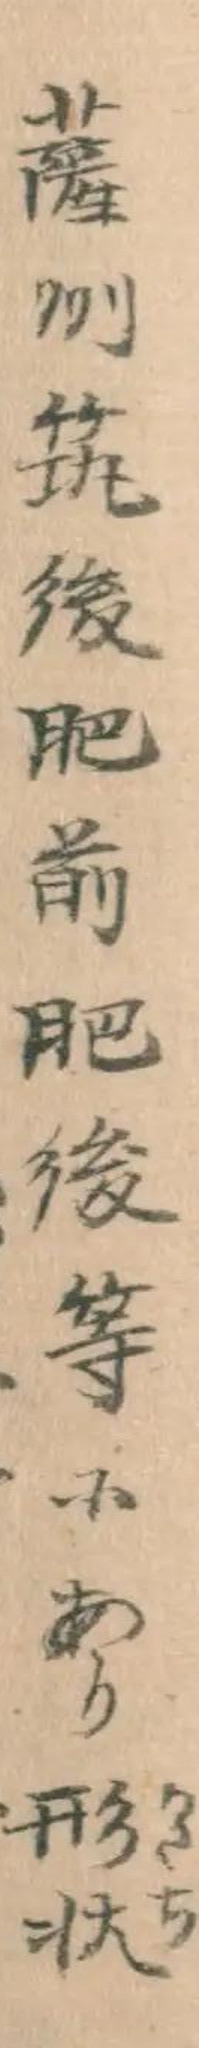薩州筑後肥前肥後等にあり形状
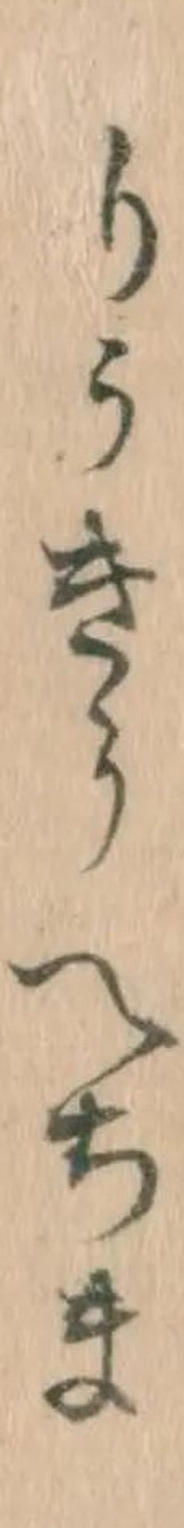りうきうへちま
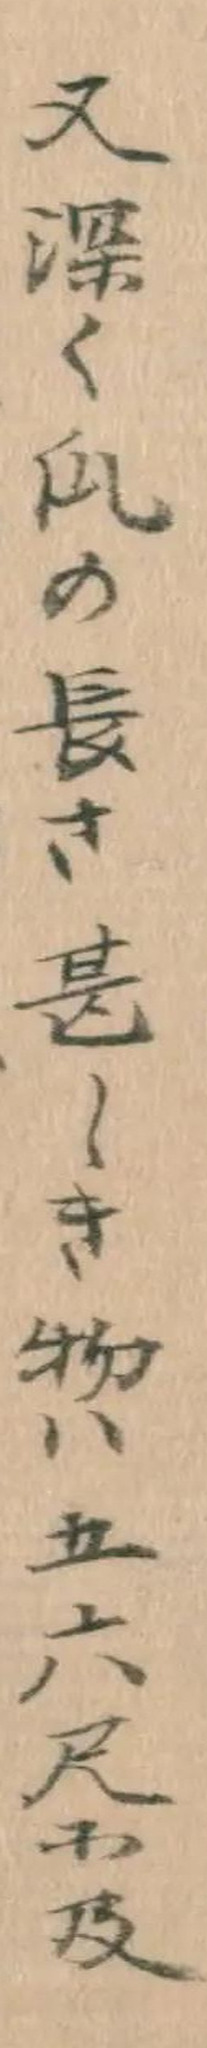又深く瓜の長さ甚しき物は五六尺に及
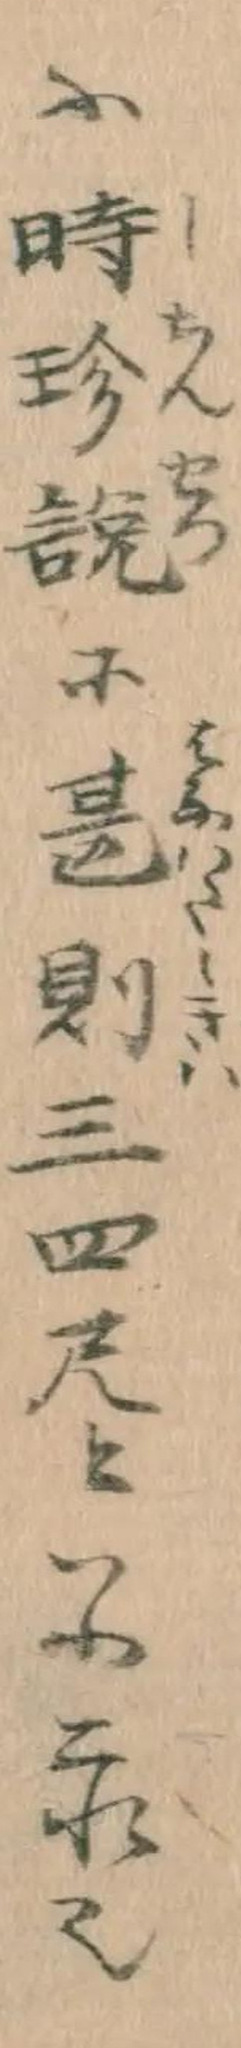ふ時珍説に甚則三四尺といふこれ也

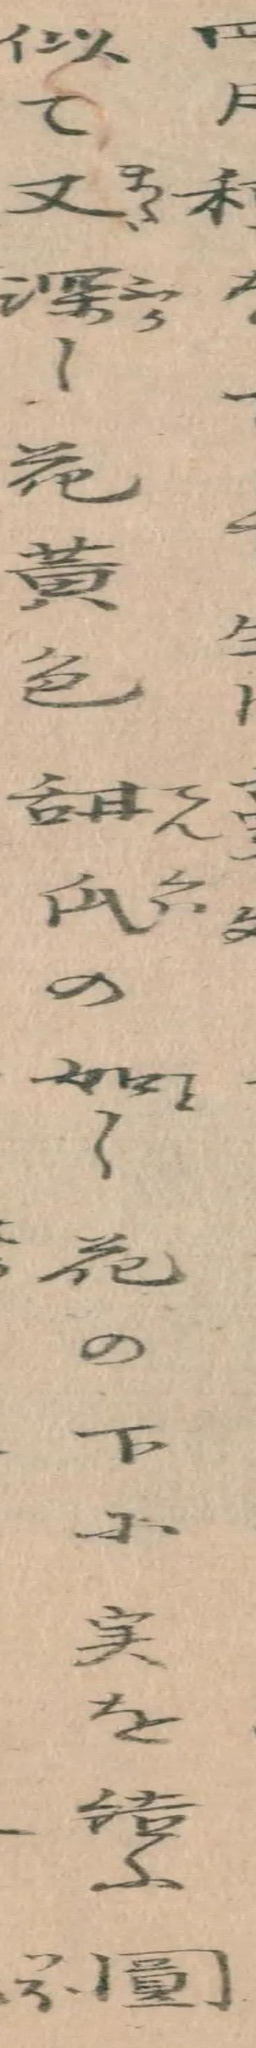似て又深し花黄色甜瓜の如し花の下に実を結ふ円
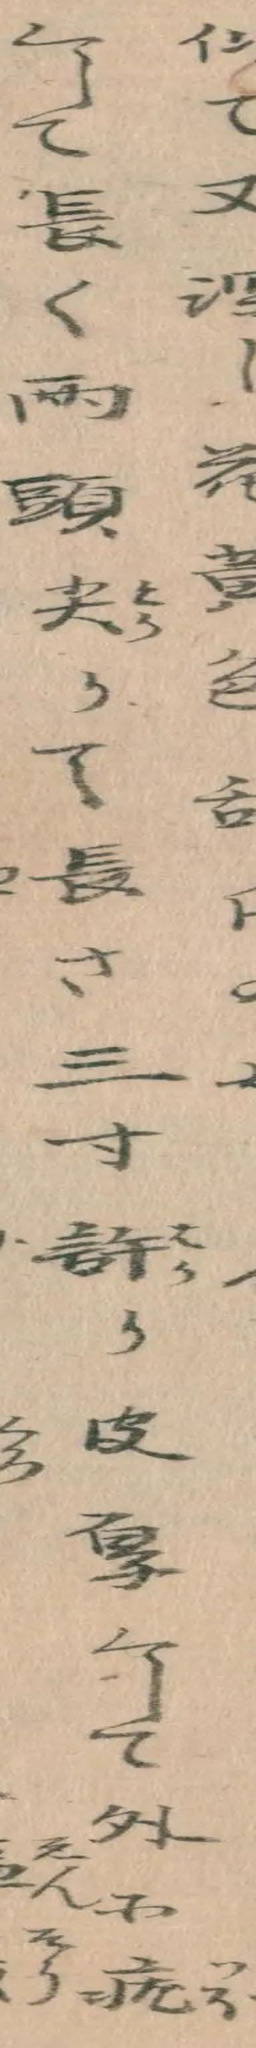くして長く両頭尖りて長さ三寸許り皮厚くして外に疣
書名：本草図譜. 巻52-54
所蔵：国立国会図書館 National Diet Library, JAPAN
